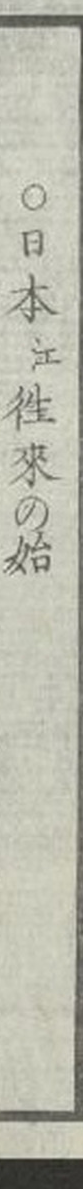○日本江徃来の始
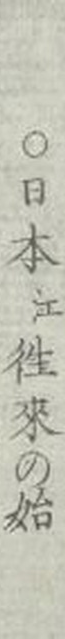○日本江徃来の始
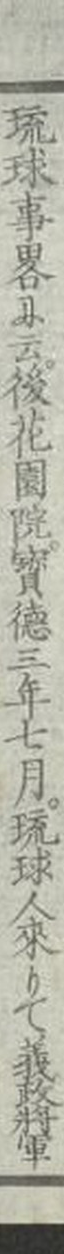琉球事略に云。後花園院。宝徳三年七月。琉球人来りて義政将軍
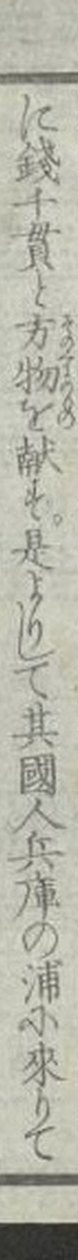に銭千貫と方物を献す。是よりして其国人兵庫の浦に来りて
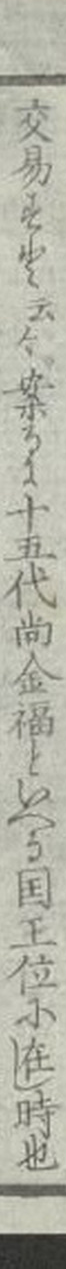交易すと云々。案るに十五代尚金福といへる国王位に在し時也
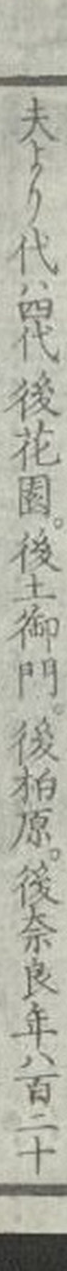夫より代は四代後花園。後土御門。後柏原。後奈良年は百二十
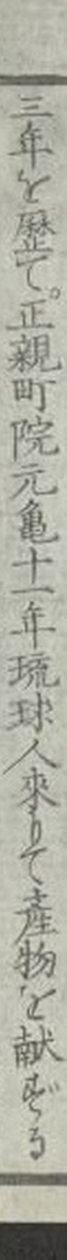三年を歴て。正親町院元亀十一年琉球人来りて産物を献ずる
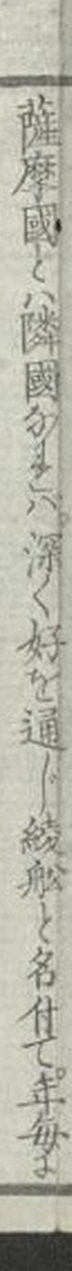薩摩国とは隣国なれば。深く好を通じ綾船と名付て。年毎に
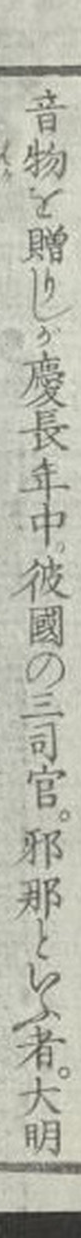音物を贈りしが慶長年中。彼国の三司官。邪那といふ者。大明
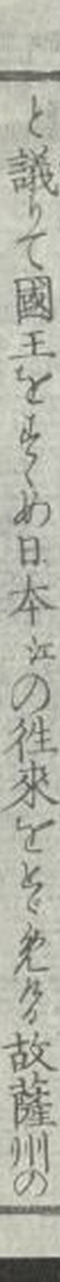と議りて国王をすゝめ日本江の徃来をとゞめける故薩州の
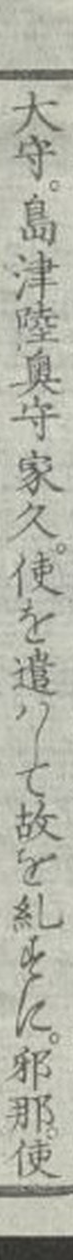大守。島津陸奥守家久。使を遣はして故を糺すに。邪那。使
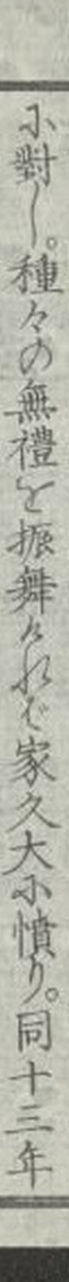に対し。種々の無礼を振舞ければ家久大に憤り。同十三年
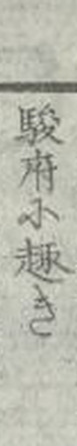駿府に趣き
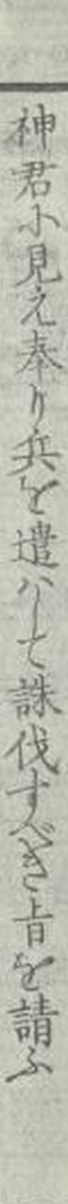神君に見え奉り兵を遣はして誅伐すべき旨を請ふ
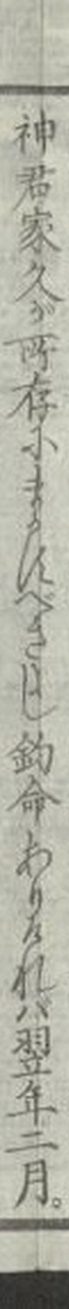神君家久が所存にまかすべきよし鈞命ありければ翌年二月。
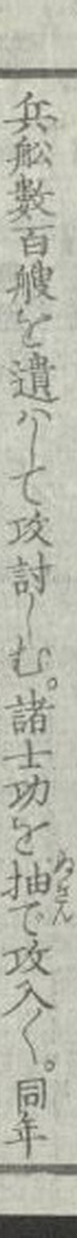兵船数百艘を遣はして攻討しむ。諸士功を抽で攻入し。同年
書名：中山国使略
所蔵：University of the Ryukyus Library
